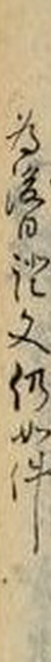為後日証文仍如件
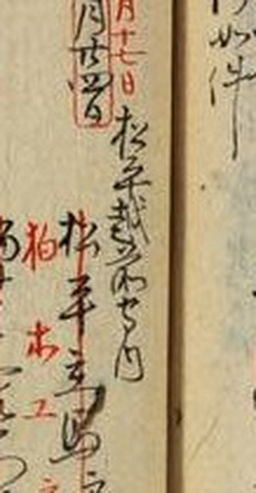松平越前守内
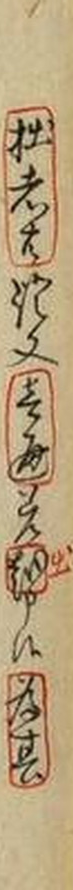拙者共証文壱通差越出申候為其
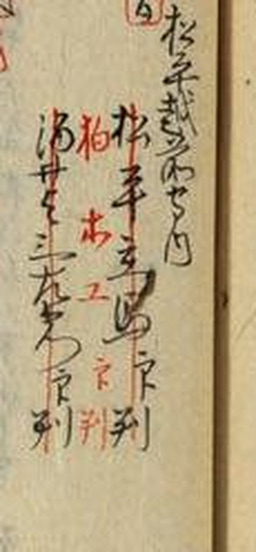松平主馬印判
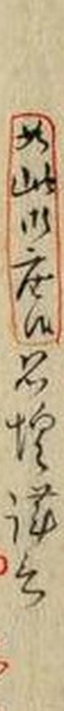如此御座候恐惶謹言
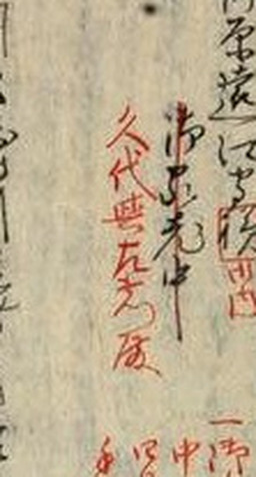久代与左衛門様
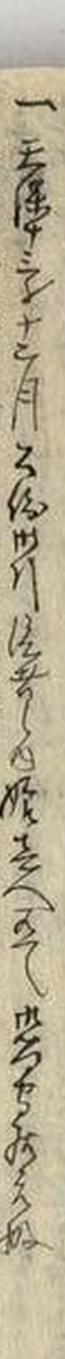一天保十三寅十二月公儀御引渡者之内姥壱人有之御留守居取扱
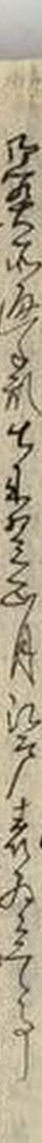御関所通手形出来翌正月江戸表為立候事
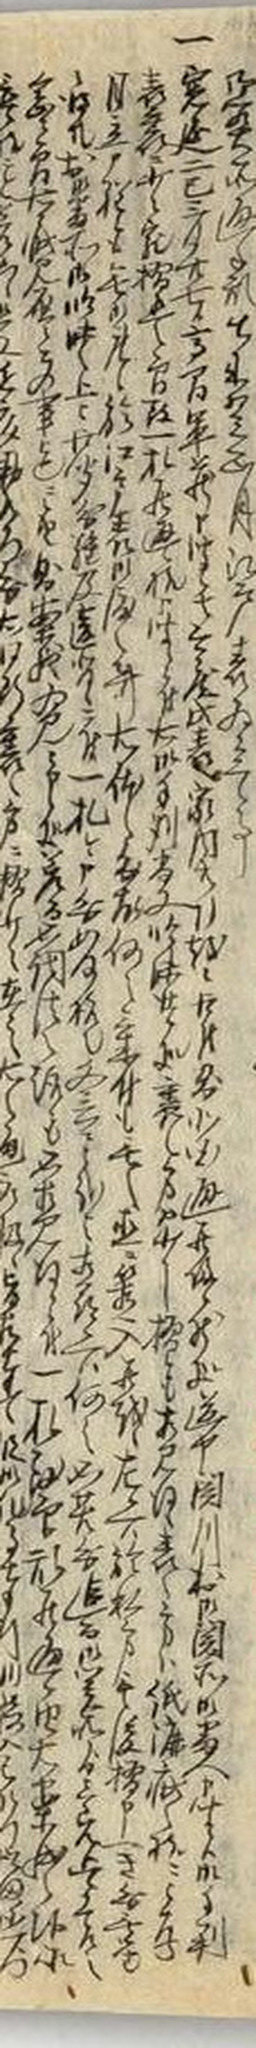目立申程ニも無御座候於江戸表御渡之刻右体之義故何之気付も無之直ニ箱へ入罷越候左候ヘハ於私方其後摺申へき義無御座
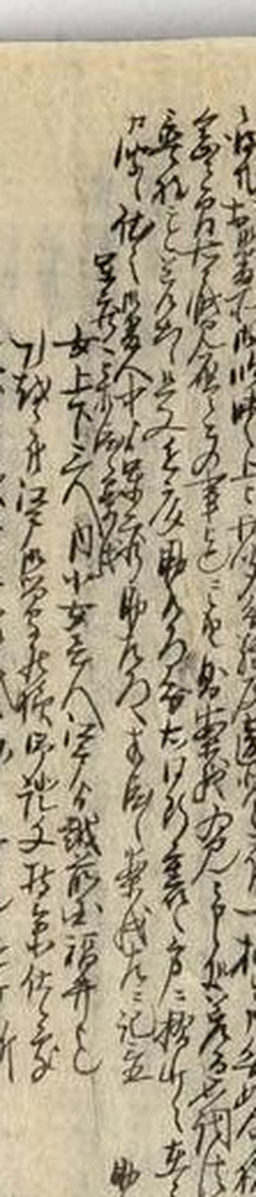口聞候依之御番人中ゟ軍蔵助左衛門へ相渡候案紙左ニ記置
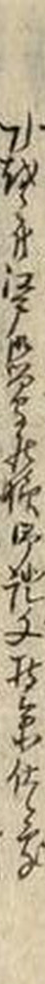引越候ニ付江戸御留守居様御証文持参仕候処
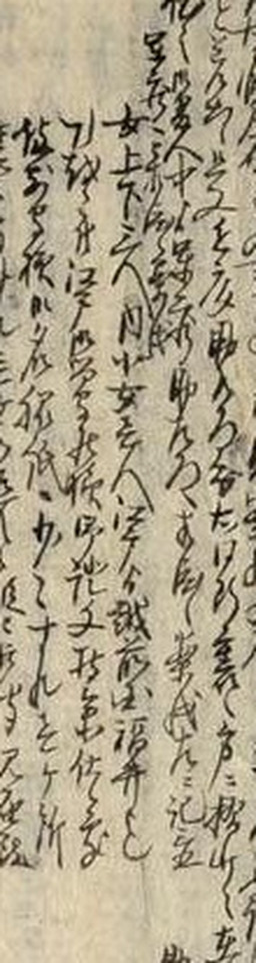女上下三人内小女壱人江戸ゟ越前国福井迄
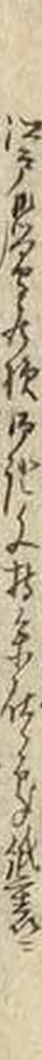江戸御留守居様御証文持参仕候処紙裏ニ
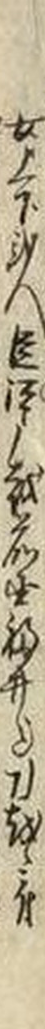女上下弐人従江戸越前国福井迄引越候ニ付
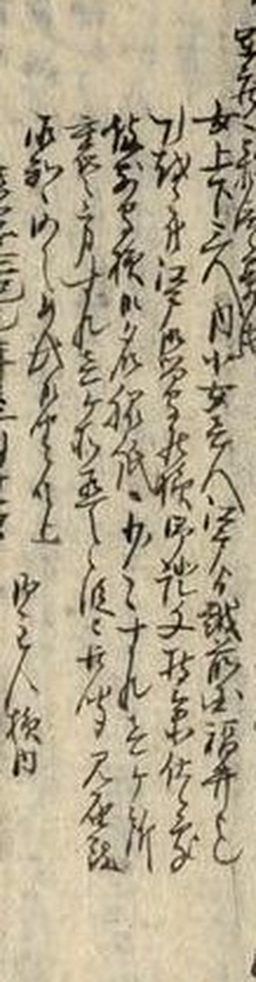備前守様御名脇紙ニ少々すれ壱ケ所
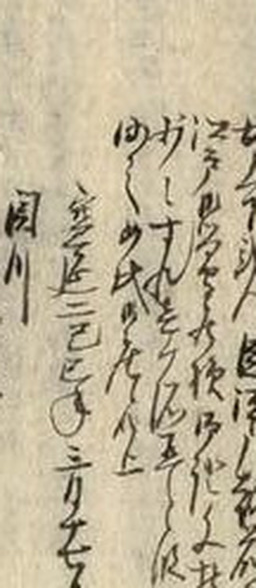仍之如此御座候以上
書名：御国他国諸事之部
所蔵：福井県文書館 Fukui Prefectural Archives
